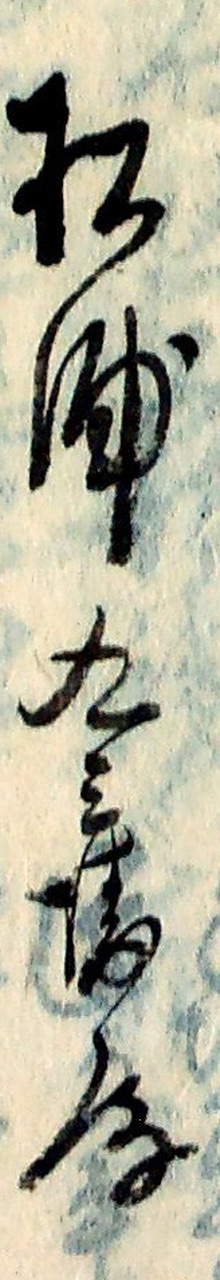松浦九兵衛殿
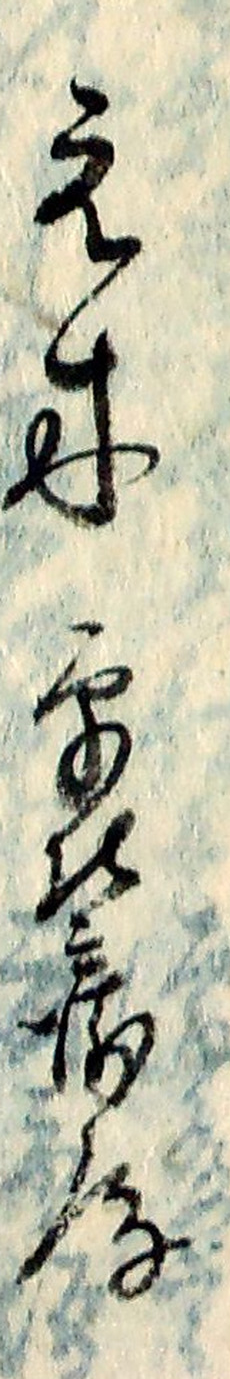元木平次兵衛殿
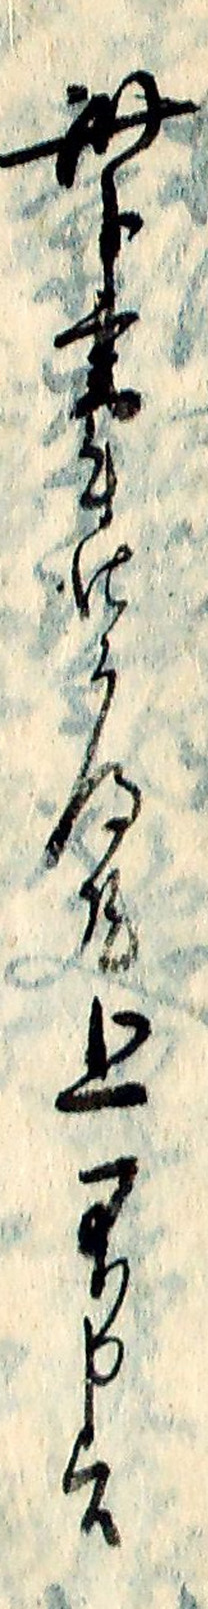此分書付仕候得共上不申候

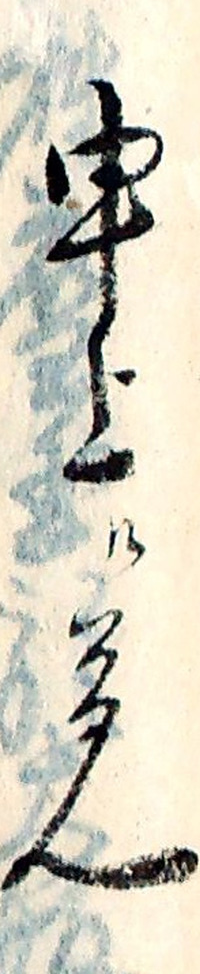申上候覚
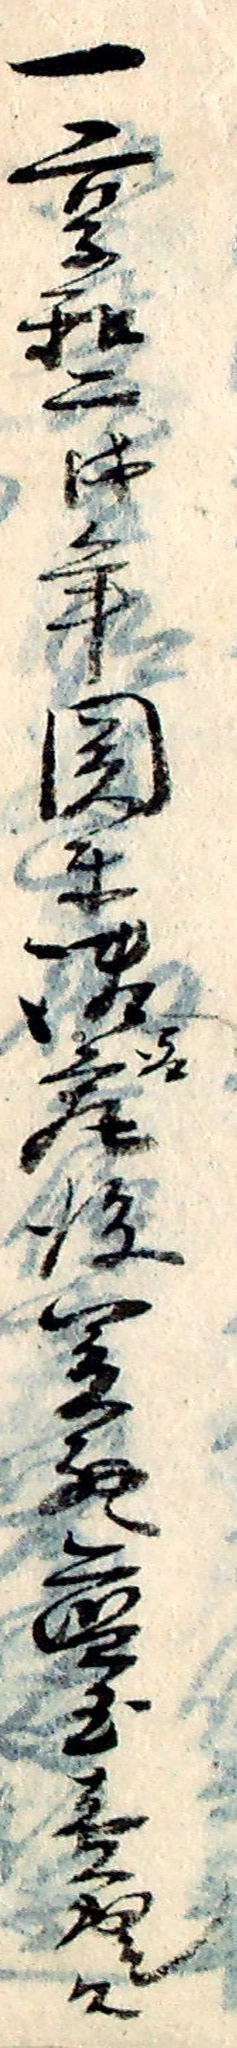一享和二戌年関東御取究後関西へ藍玉売出し候
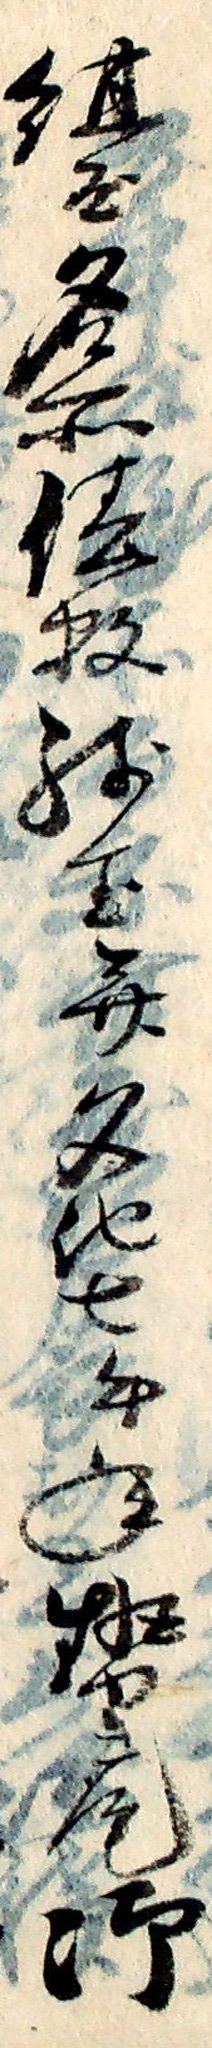紺屋名所俵数残玉文化七午年勢尻御
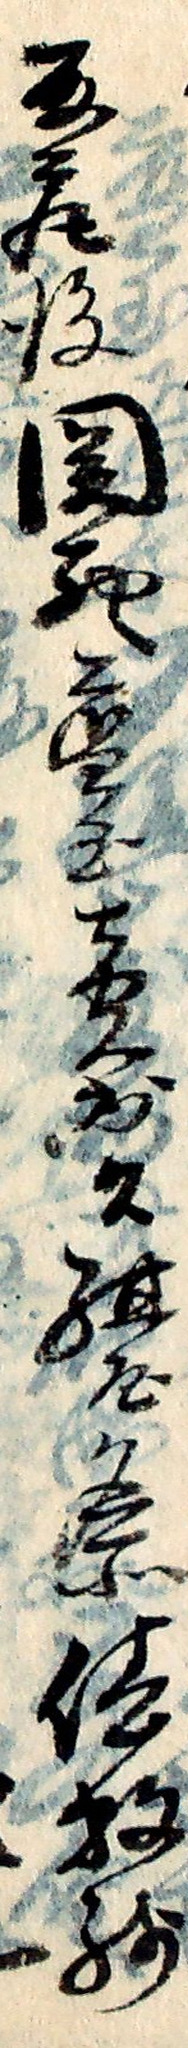取究後関西へ藍玉売出候紺屋名所俵数残
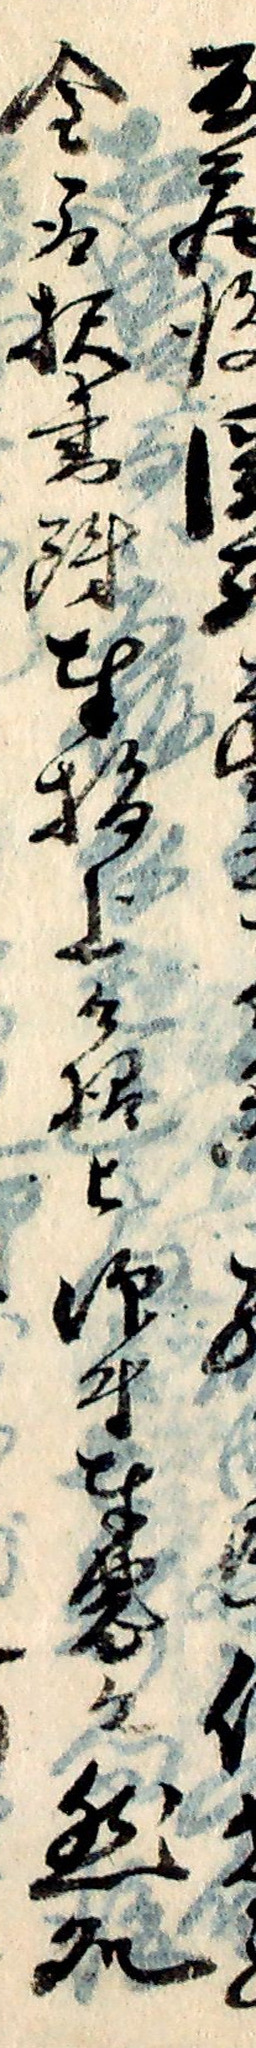金取択書附奉指上候様被仰付奉畏候然処
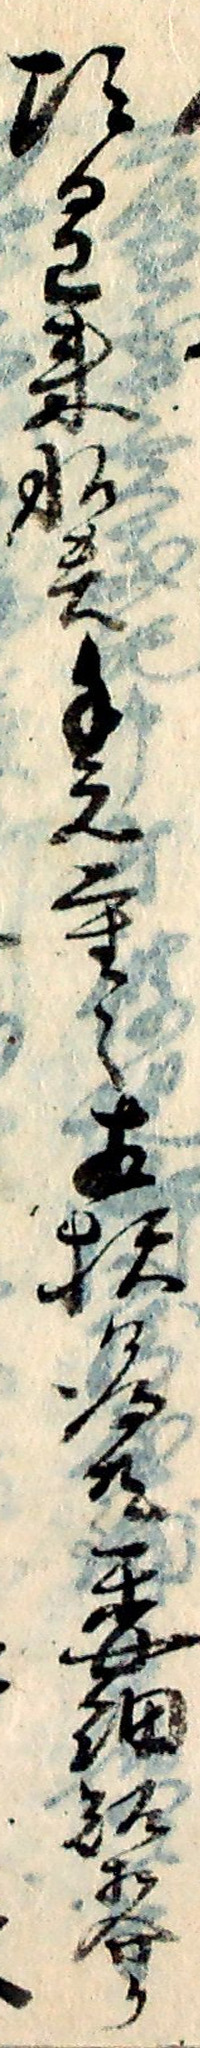頃日已来私共手元重々相択候得共委細趣相分り
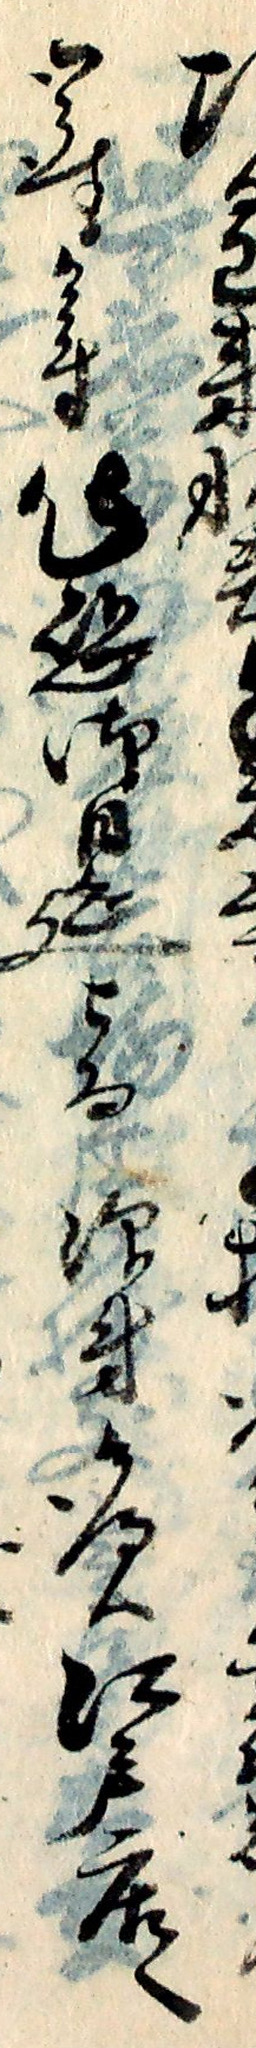御座候に付乍恐御日延被為仰付候得は江戸店へ
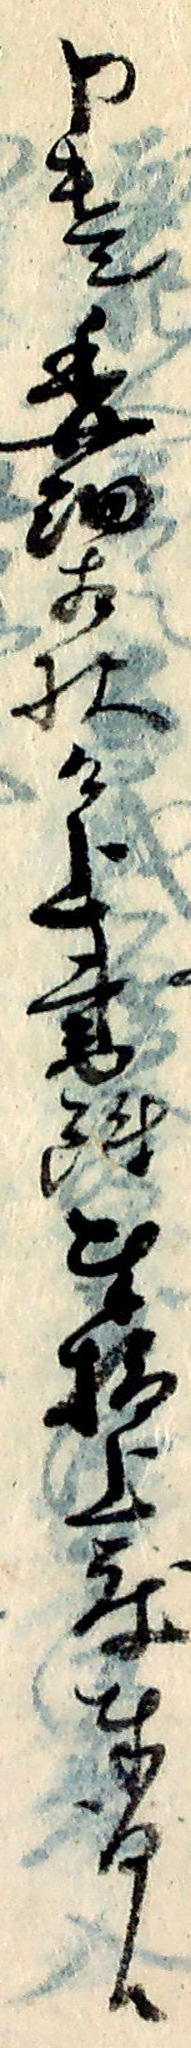申遣し委細相択候上書附奉指上度奉存候
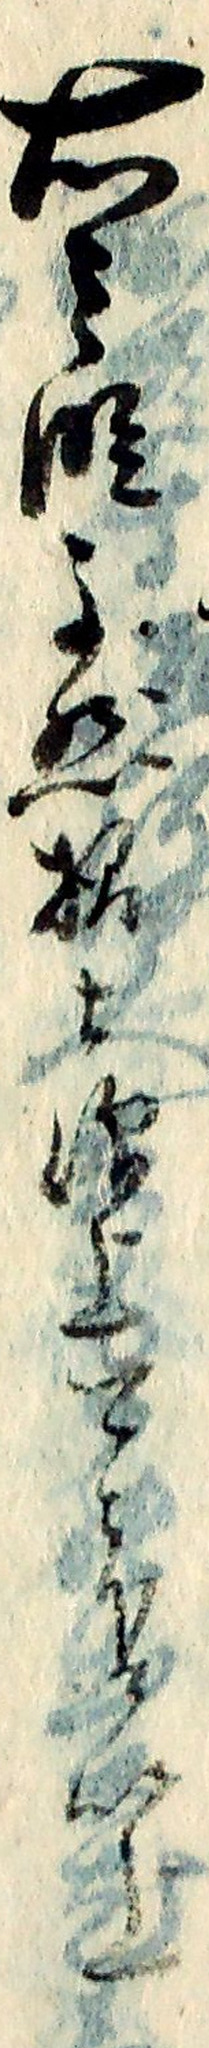右之段可然様被仰上可被下候以上
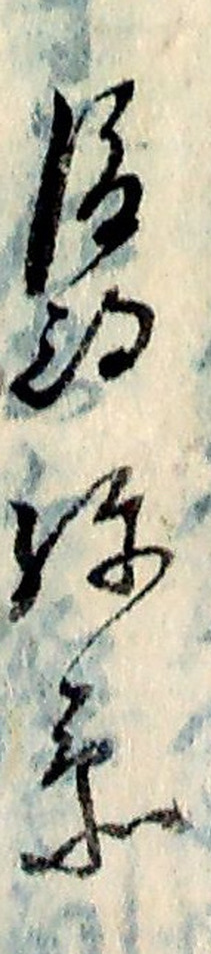渡部弥兵衛
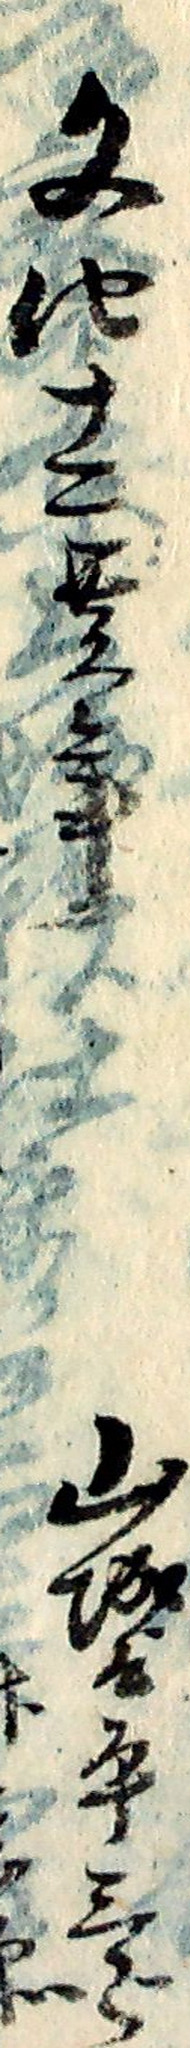文化十二亥年山城屋平三郎
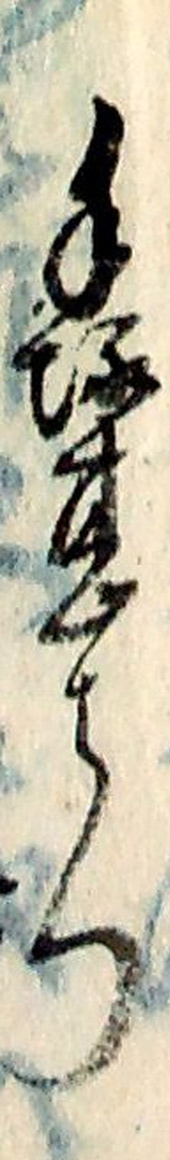手塚甚右衛門
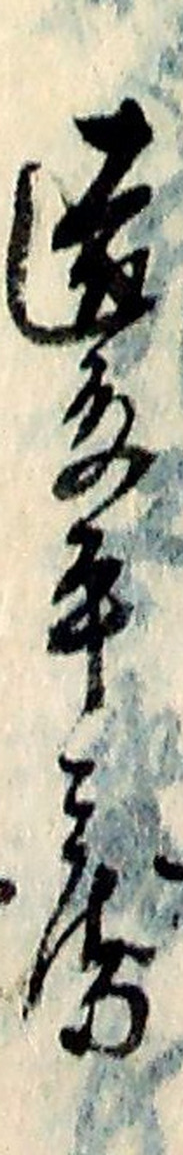遠藤平兵衛
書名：諸御願書控(後藤氏壱番）
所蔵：鳴門教育大学 Naruto University of Education
